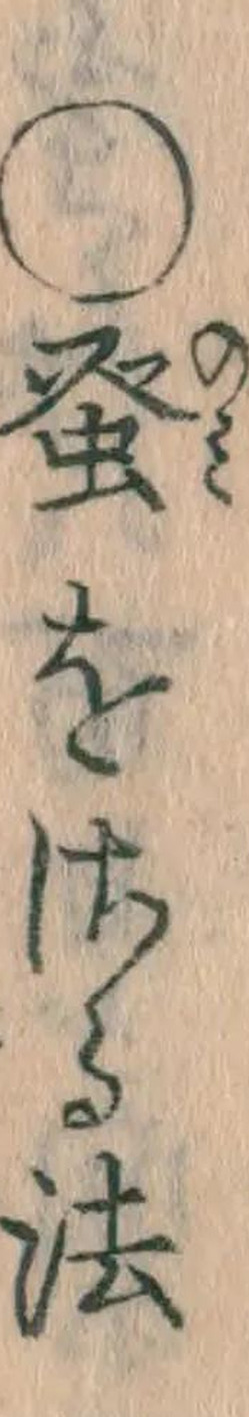○蚤をさる法
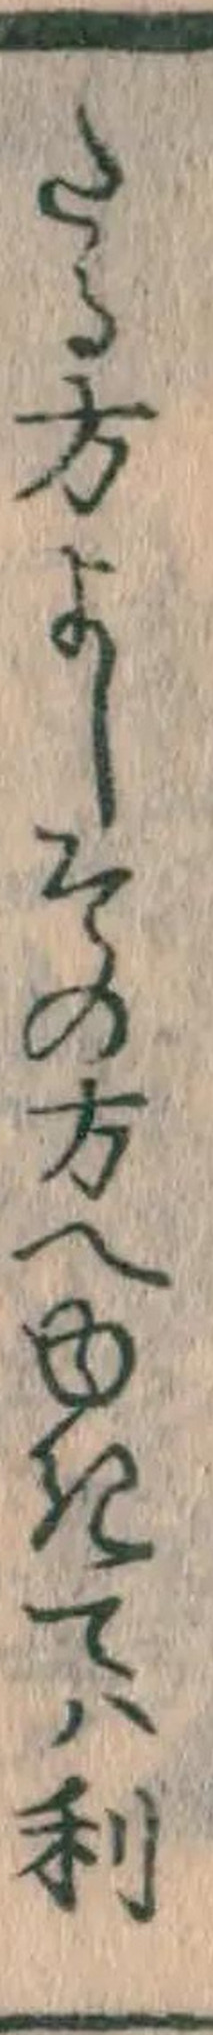たる方よしその方へゆきては利
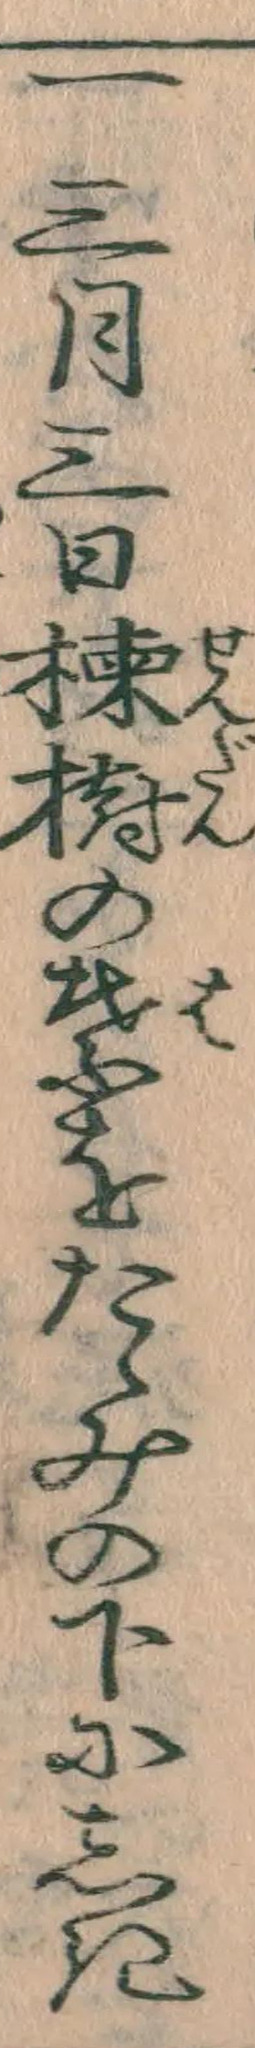一三月三日楝樹の葉をたゝみの下にしき
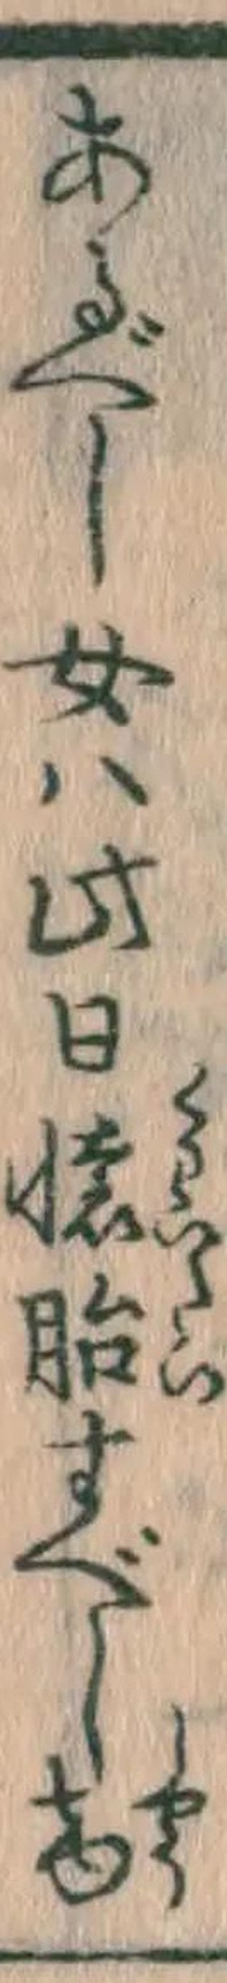あるべし女は此日懐胎すべし商
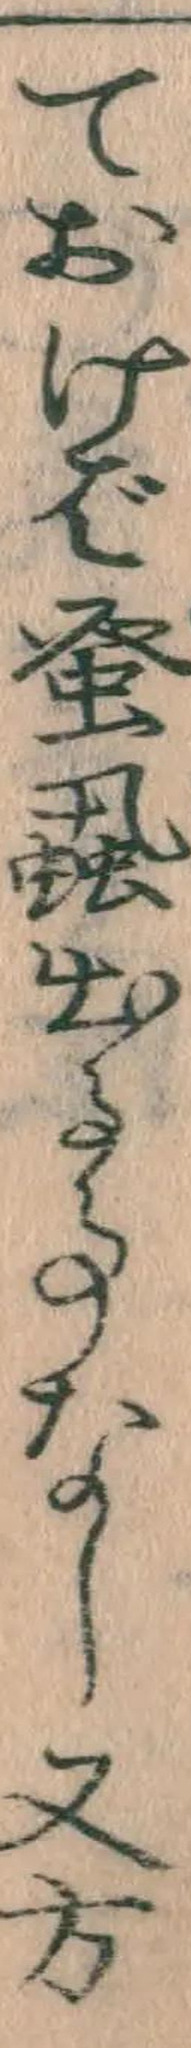ておけば蚤蝨出る事なし又方
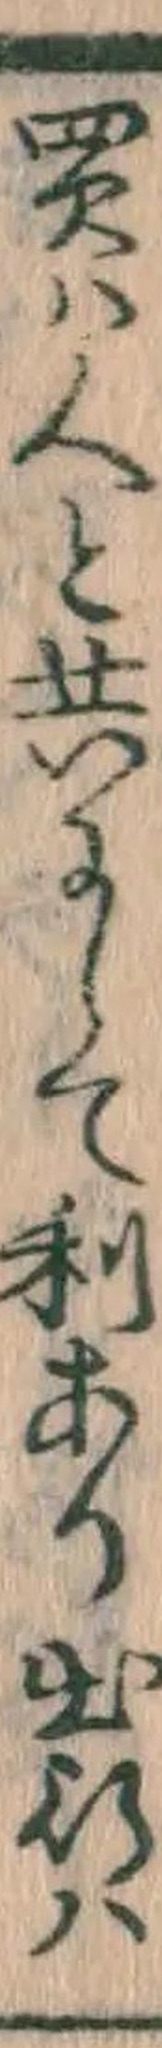売は人と共にして利あり出行は
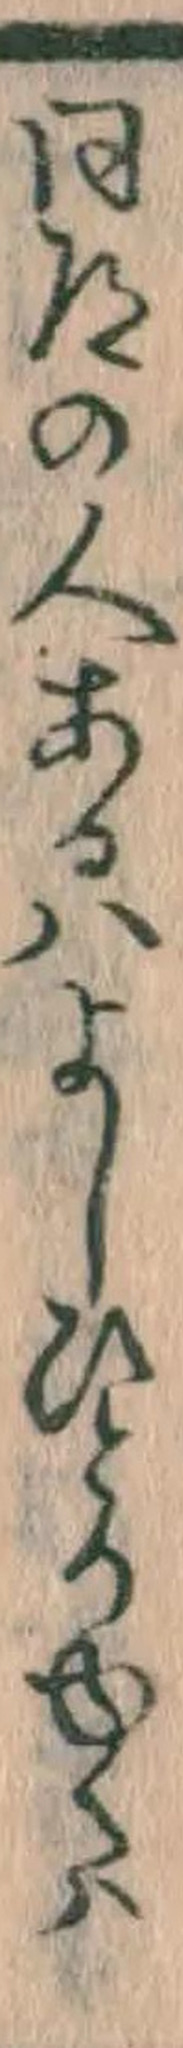同道の人あるはよしひとりゆくは
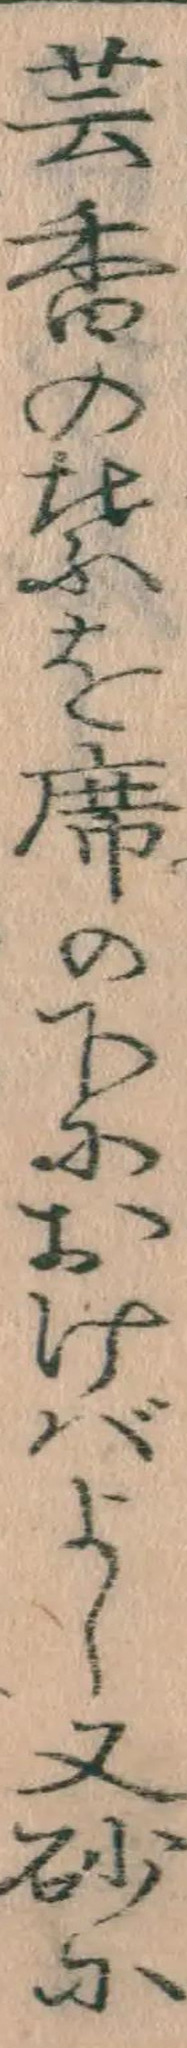芸香の葉を席の下におけばよし又砂に
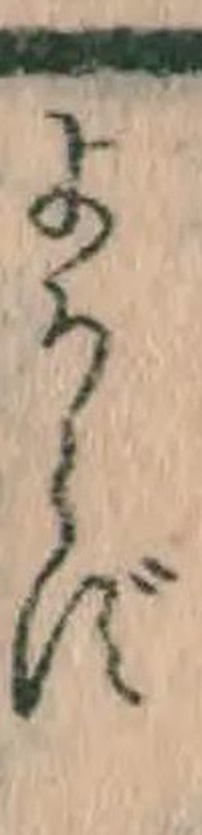よからず
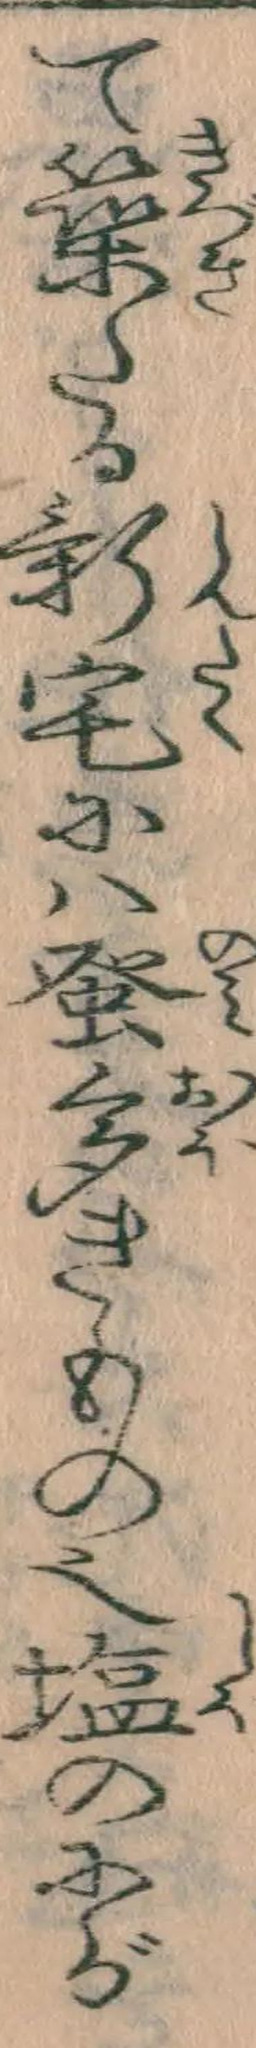て築たる新宅には蚤多きもの也塩のにが
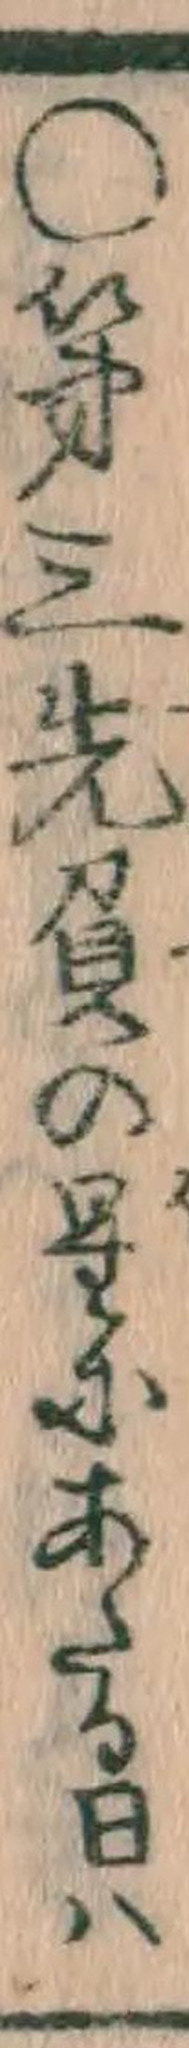○第三先負の星にあたる日は
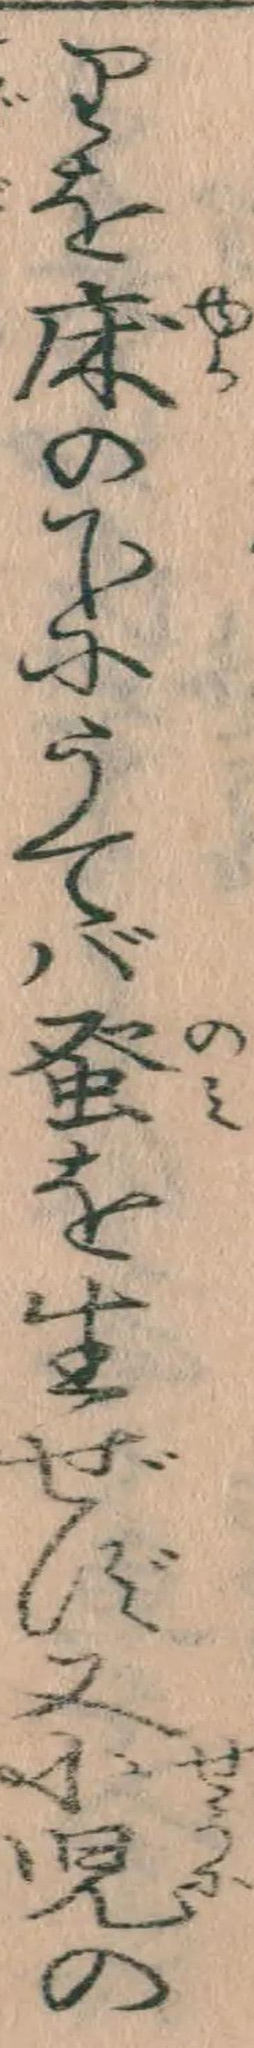りを床の下にうてば蚤を生ぜず又小児の
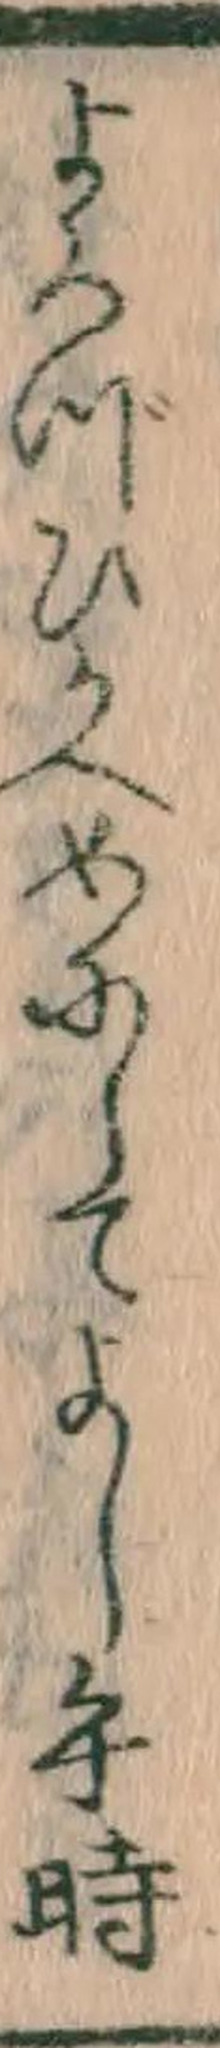よろづひかへめにしてよし午時
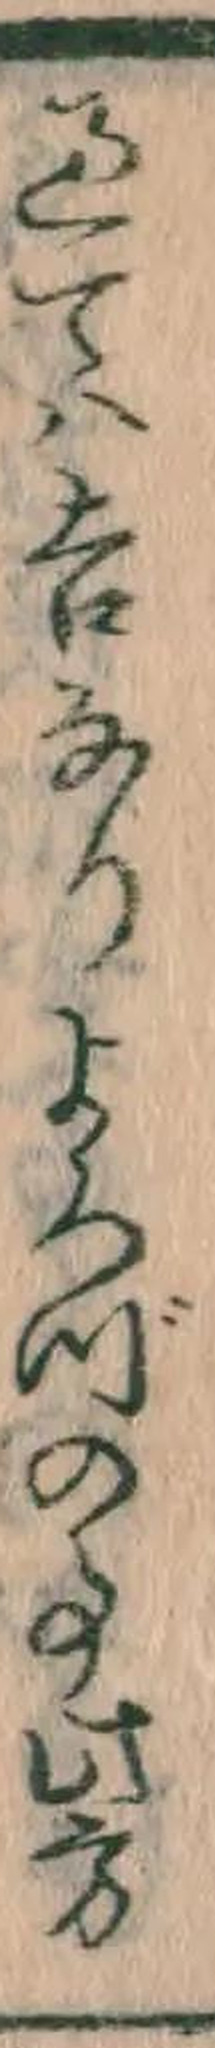過ては吉なりよろづの事此方
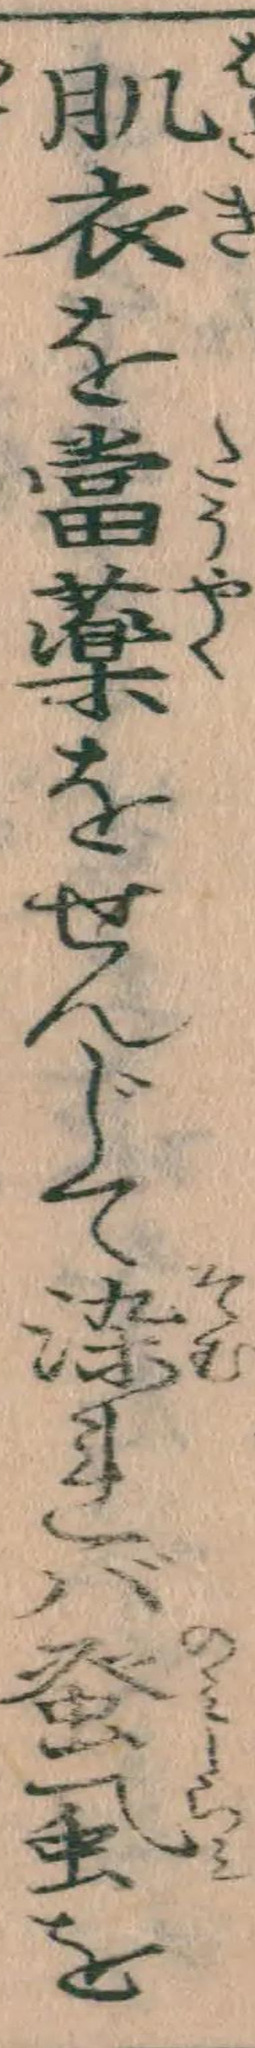肌着を当薬をせんじて染れば蚤蝨を
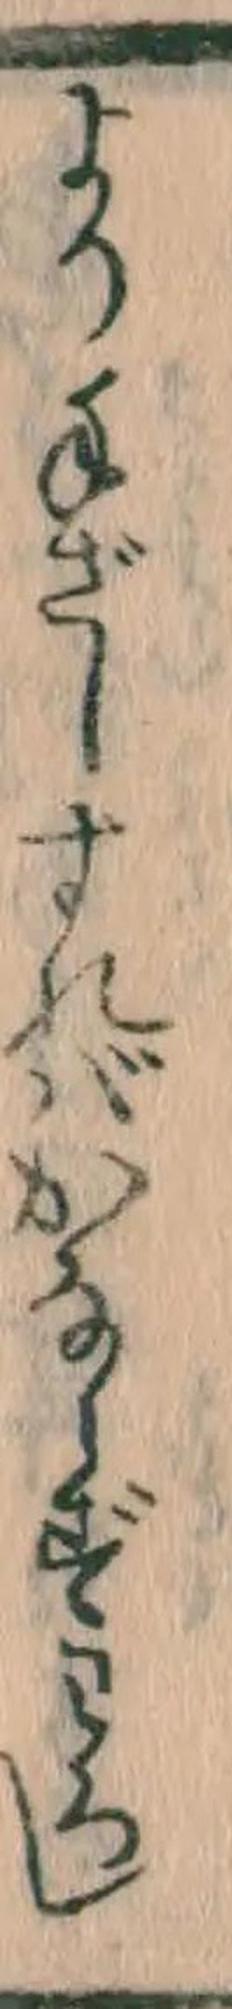より手ざしすればかならずわろし
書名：広益秘事大全 3巻. [1]
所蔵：国立国会図書館 National Diet Library, JAPAN
